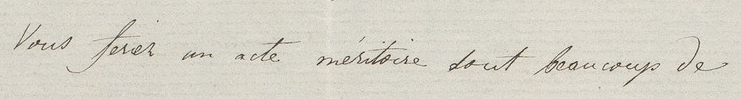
Vous feriez un acte méritoire dont beaucoup de
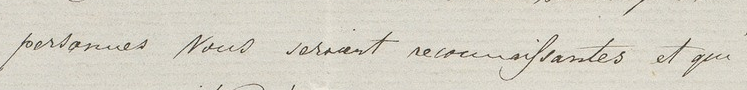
personnes vous seraient reconnaissantes et qui
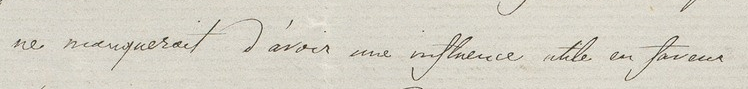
ne manquerait d'avoir une influence utile en faveur
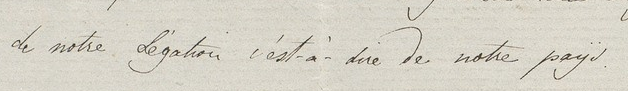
de notre Légation c'est-à-dire de notre pays.
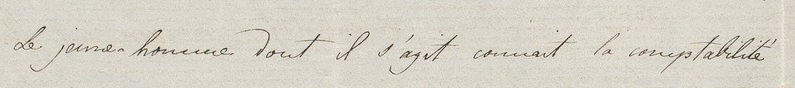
Le jeune homme dont il s'agit connait la comptabilité
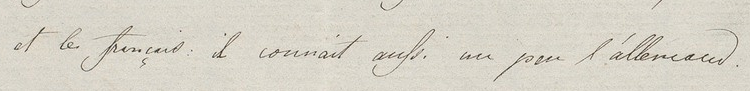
et le français: il connait aussi un peu l'allemand.
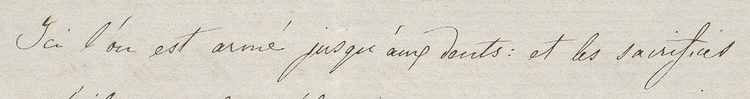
Ici l'on est armé jusque'aux dents: et les sacrifices
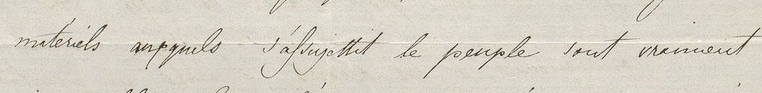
matériels auxquels s'assujettit le peuple sont vraiment
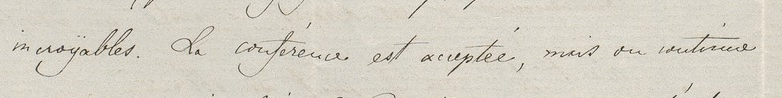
incroyables. La conférence est acceptée, mais on continue
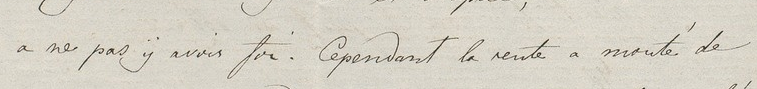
a ne pas y avoir foi. Cependant la rente a monté de
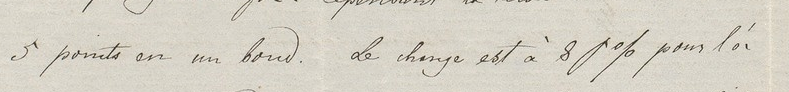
5 points en un bond. Le change est à 8 p% pour l'or
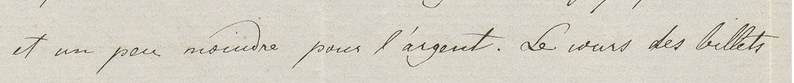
et un peu moindre pour l'argent. Le cours des billets
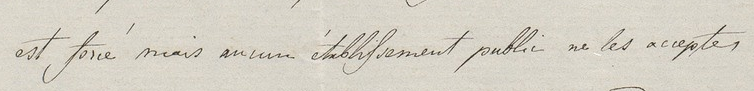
est forcé mais aucun établissement public ne les accepte,
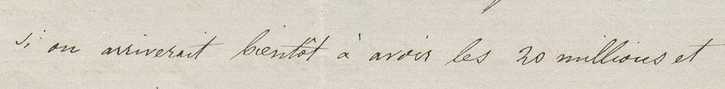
si on arriverait bientôt à avoir les 20 millions et
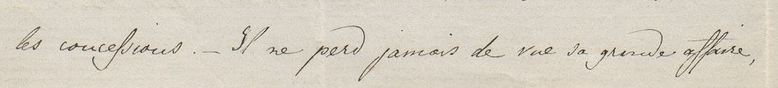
les concessions. – Il ne perd jamais de vue sa grande affaire,
